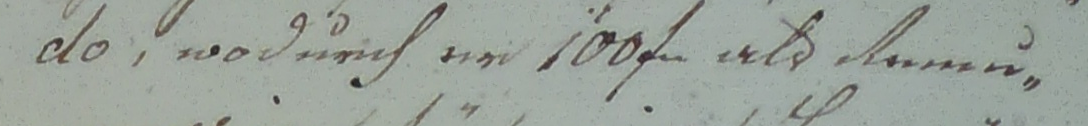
do, wodurch er 100fn als Remu¬
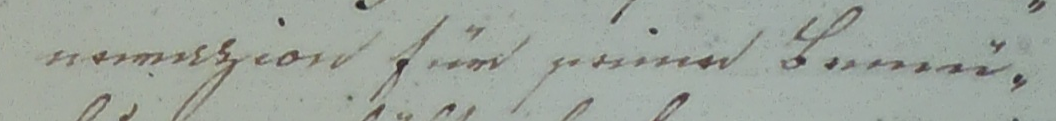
nerazion für seine Bemü¬
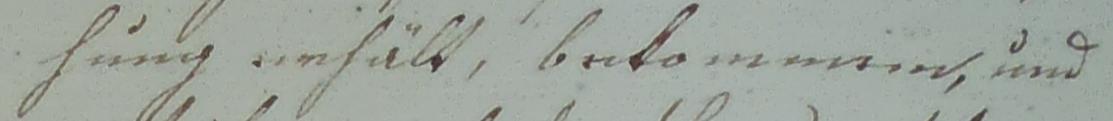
hung erhält, bekommen, und
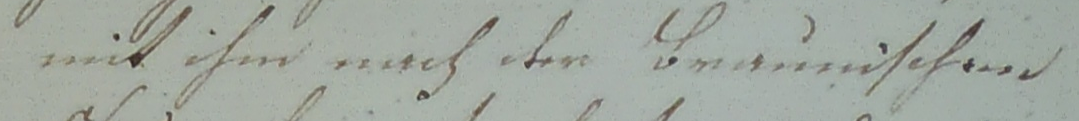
mit ihm nach der Braunischen
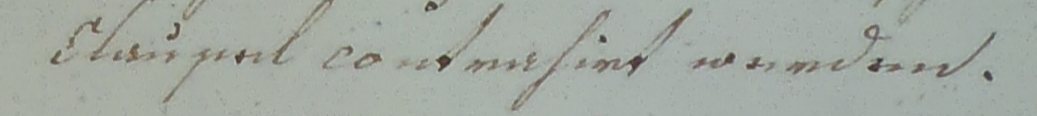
Clausel contrahirt werden.
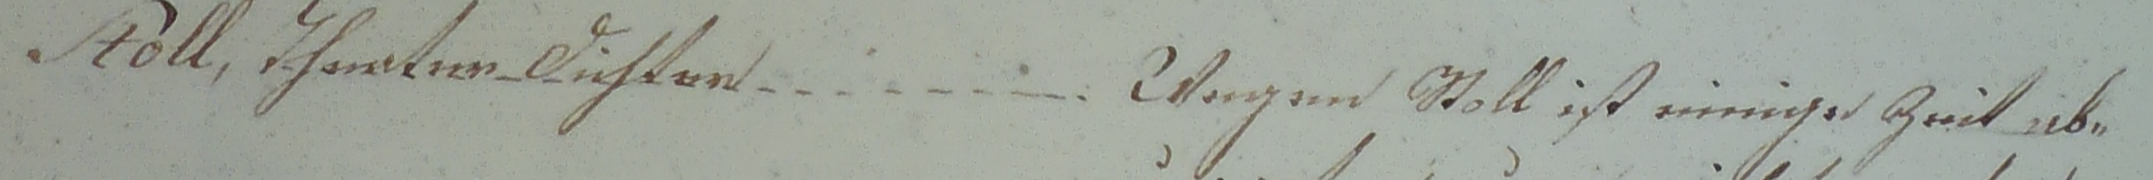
Stoll, Theater_Dichter ……… Wegen Stoll ist einige Zeit ab¬
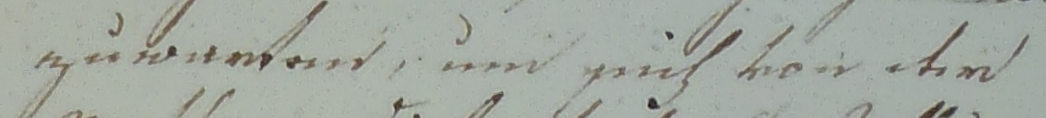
zuwarten, um sich von der
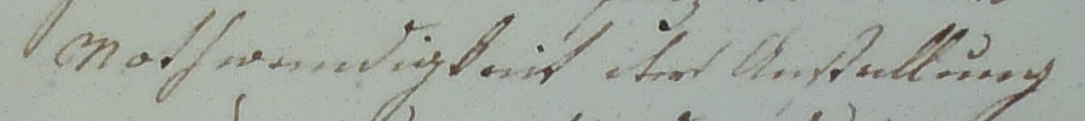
Nothwendigkeit der Anstellung
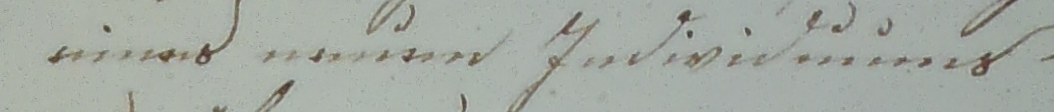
eines neuen Individuums
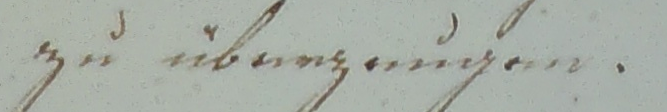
zu überzeugen.
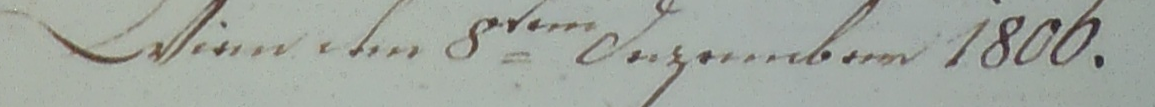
Wien den 8t͇en Dezember 1806.
